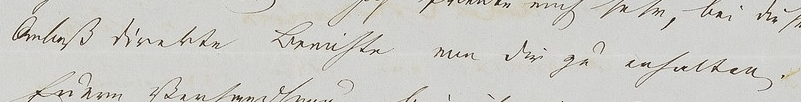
Anlaß direkte Berichte von Dir zu erhalten.
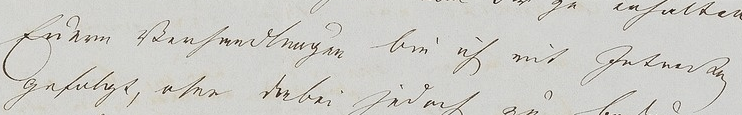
Euern Verhandlungen bin ich mit Intresse
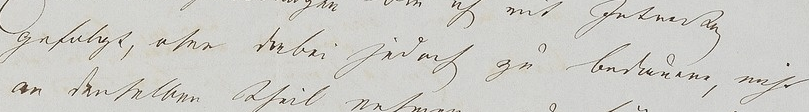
gefolgt, ohne dabei jedoch zu bedauern, nicht
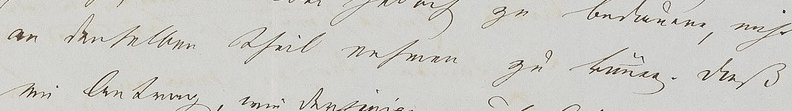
an denselben Theil nehmen zu können. Daß
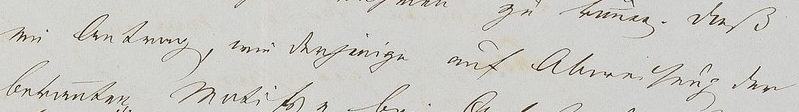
ein Antrag, wie derjenige auf Abweisung der
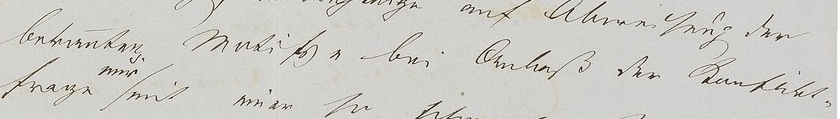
bekannten Motive bei Anlaß der Konflikt-
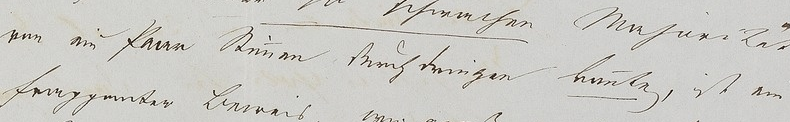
von ein Paar Stimmen durchdringen konnte, ist ein
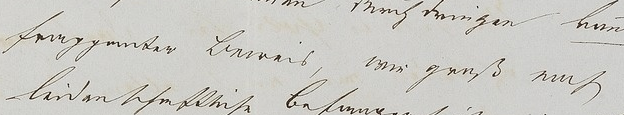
frappanter Beweis, wie groß noch
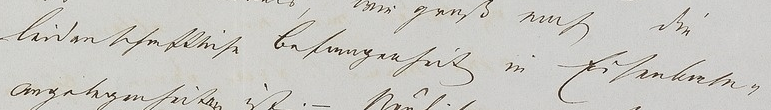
leidenschaftliche Befangenheit in Eisenbahn-
